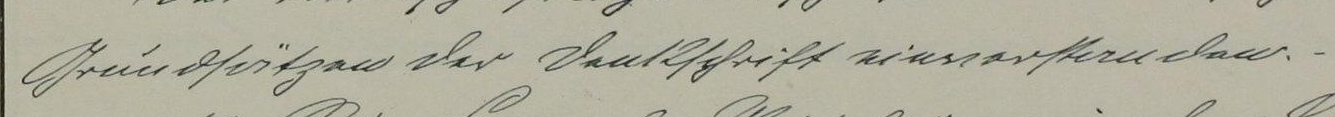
Grundsätzen der Denkschrift einverstanden.
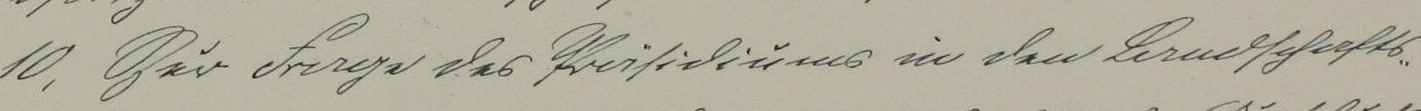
10. Zur Frage des Präsidiums in den Landschafts-
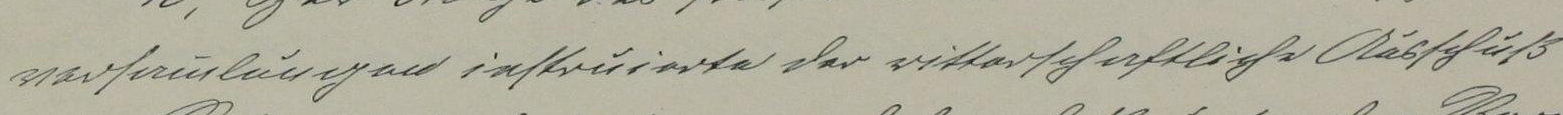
versammlungen instruierte der ritterschaftliche Ausschuß
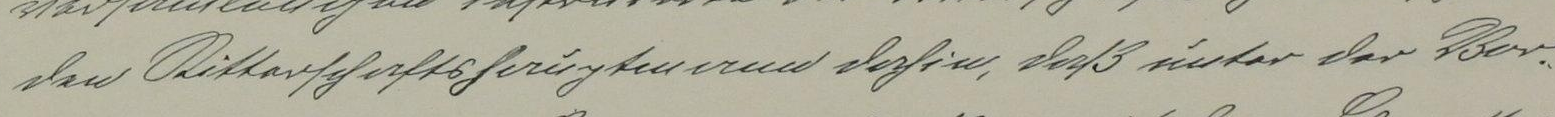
den Ritterschaftshauptmann dahin, daß unter der Vor-
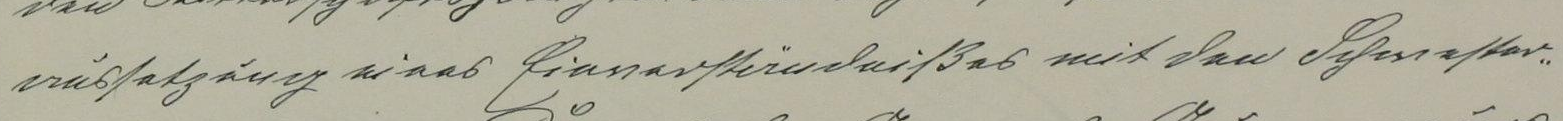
aussetzung eines Einverständnißes mit den Schwester-
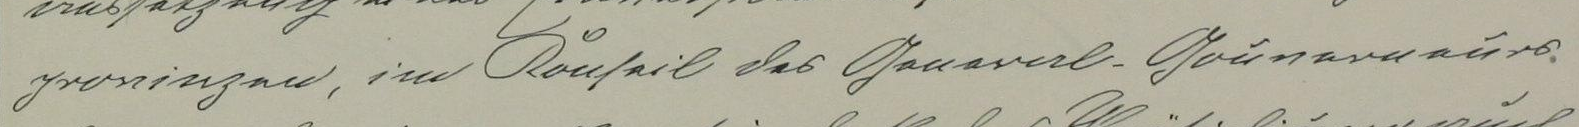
provinzen, im Konseil des General-Gouverneurs
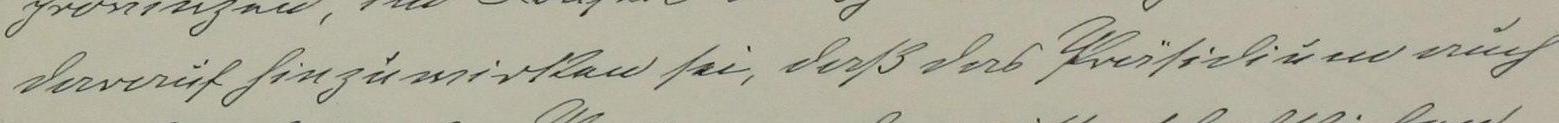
darauf hinzuwirken sei, daß das Präsidium auch
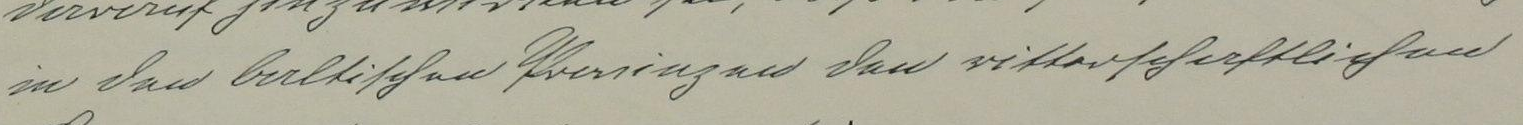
in den baltischen Provinzen den ritterschaftlichen
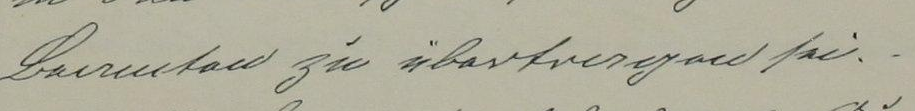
Beamten zu übertragen sei.
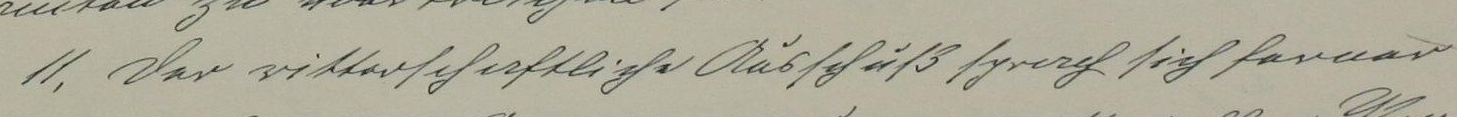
11. Der ritterschaftliche Ausschuß sprach sich ferner
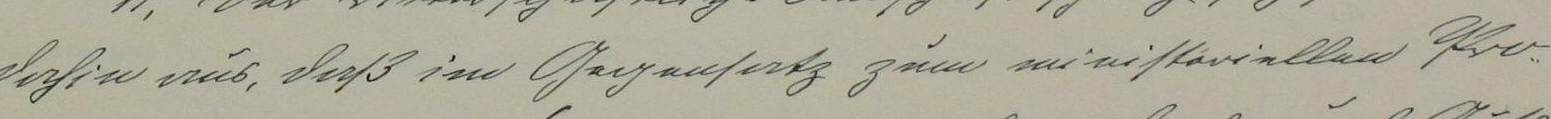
dahin aus, daß im Gegensatz zum ministeriellen Pro-
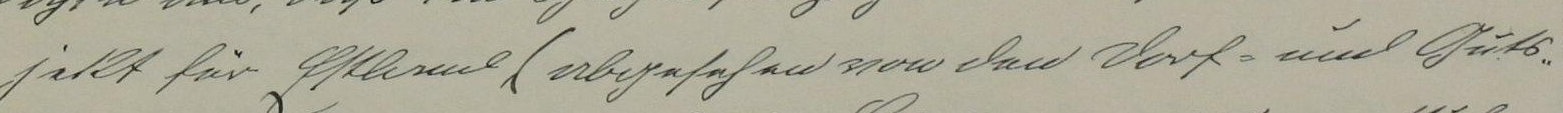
jekt für Estland (abgesehen von den Dorf- und Guts-
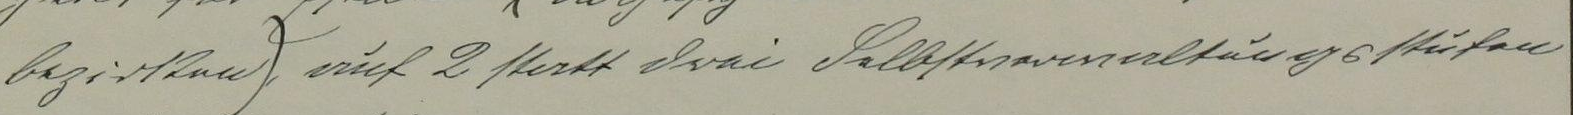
bezirken) auf 2 statt drei Selbstverwaltungsstufen
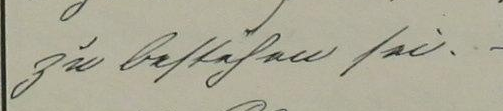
zu bestehen sei.
